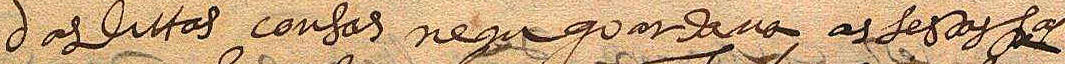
das dittas cousas nem goardaua as sestas fras
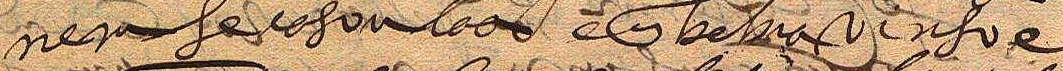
nem se casou laa e q̄ bebia vinho e
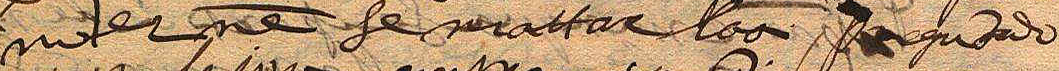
nō ter nē se mattar laa, pregūtado
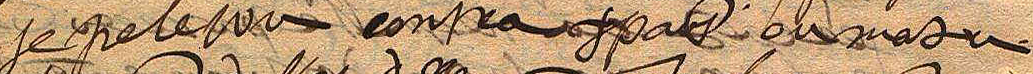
se pelejou contra xpaõs ou matou
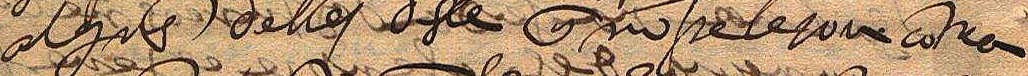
algus̄ delles disse q̄ nō pelejou cōtra
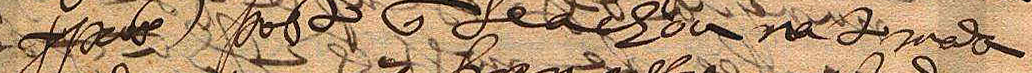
xpaõs posto q̄ se achou na tomada
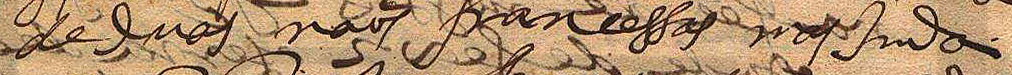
de duas naos francessas mas Jnda
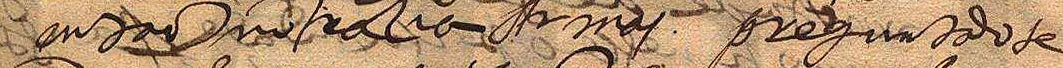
entaõ nō trazia Armas. preguntado se
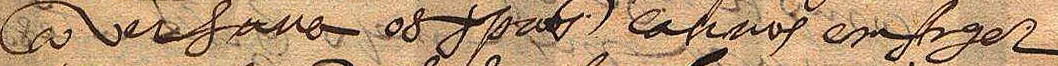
c̄oversaua os xpaõs catiuos em ArgeL
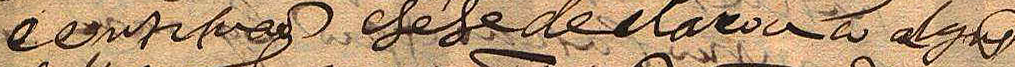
e em tituaõ e se se declarou c̄o algūs
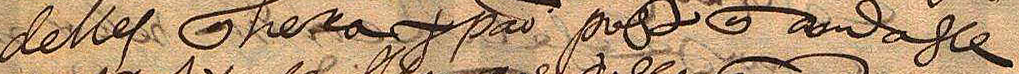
delles q̄ hera xpão posto q̄ amdasse
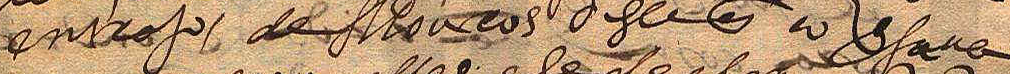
en trajos de Mouros disse q̄ c̄oꝟsaua
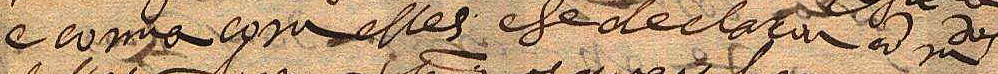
e comia com elles e se declarou cō mtos
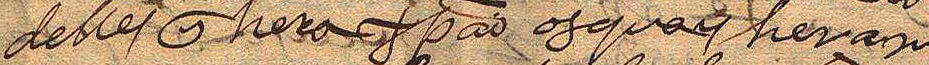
delles q̄ hera xpão os quais heram
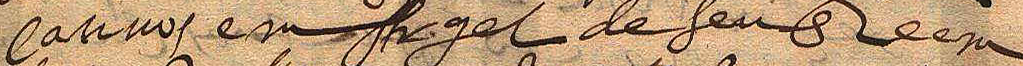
Catiuos em Argel de seu sor e em
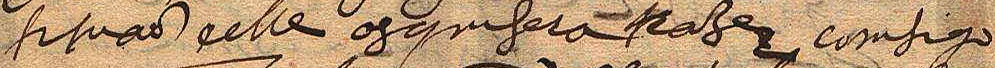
tituaõ e elle os quisera trazer comsigo
